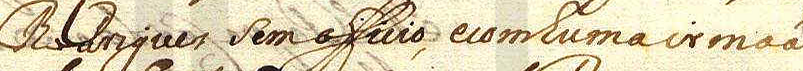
Rodrigues sem officio, e com huma irmaã
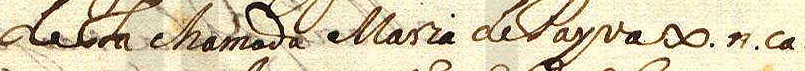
desta chamada Maria de Payva x. n. ca
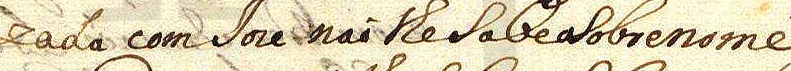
zada com Ioze naõ lhe sabe sobrenome,
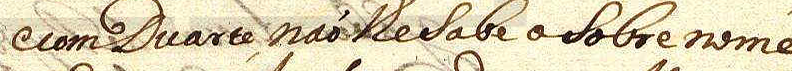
e com Duarte, naõ lhe sabe o sobrenome
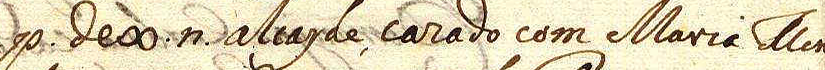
p. de x. n. alcayde, cazado com Maria Men
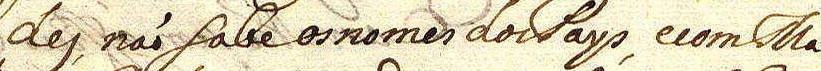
des, naõ sabe os nomes dos Pays, e com Ma
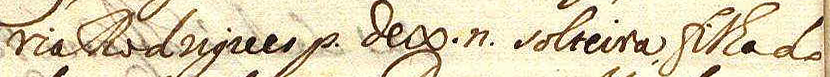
ria Rodrigues p. de x. n. solteira filha do
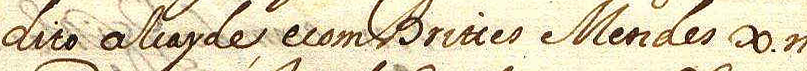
dito alcayde, e com Brittes Mendes x. n.
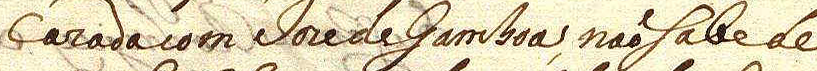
cazada com Ioze de Gamboa, naõ sabe de
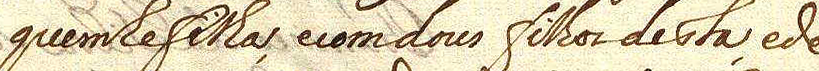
quem he filha, e com dous filhos desta, e de
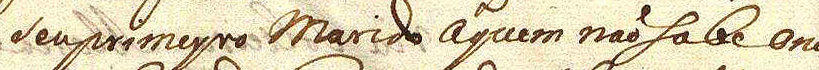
seu primeyro marido a quem naõ sabe o no
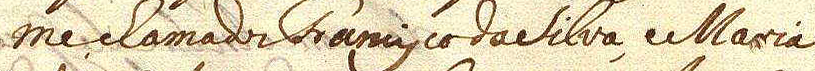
me chamados Francisco da Silva, e Maria
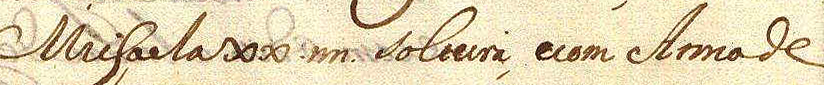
Michaela xx. nn. solteira, e com Anna de
